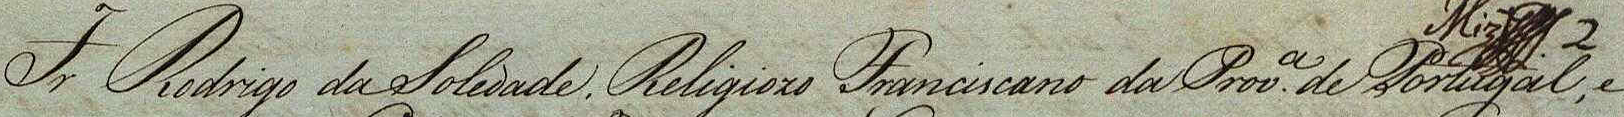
Fr Rodrigo da Soledade Religiozo Franciscano da Prov.a de Portugal, e
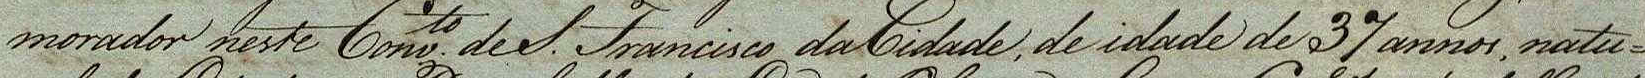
morador neste Conv.to de S. Francisco da Cidade, de idade de 37 annos, natu
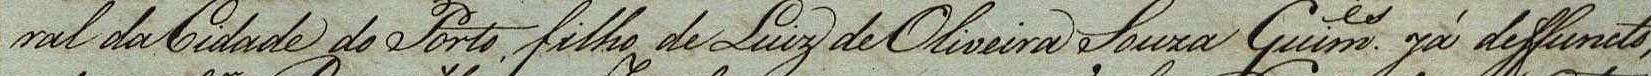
ral da Cidade do Porto, filho de Luiz de Oliveira Souza Guim.es já deffuncto,
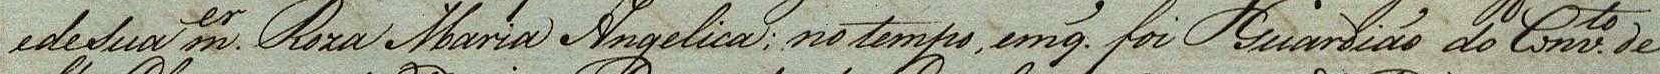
e de sua m.er Roza Maria Angelica: no tempo, em q̄ foi Guardiaõ do Conv.to de
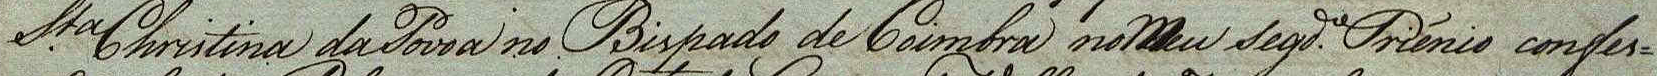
S.ta Christina da Povoa no Bispado de Coimbra no meu segd.o Triénio confes
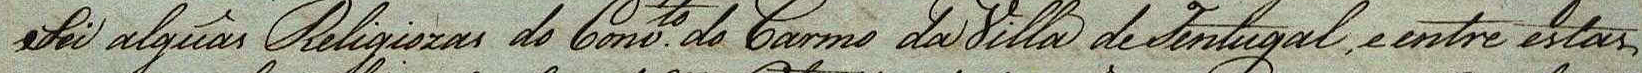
Sei algūas Religiozas do Conv.to do Carmo da Villa de Tentugal, e entre estas
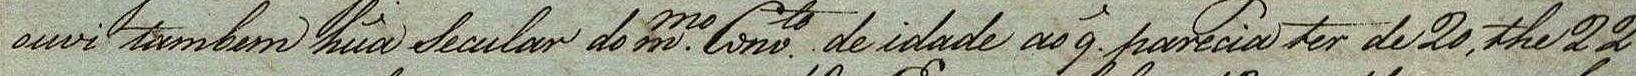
ouvi tambem hūa secular do m.mo Conv.to de idade ao q̄ parecia ter de 20, the 22
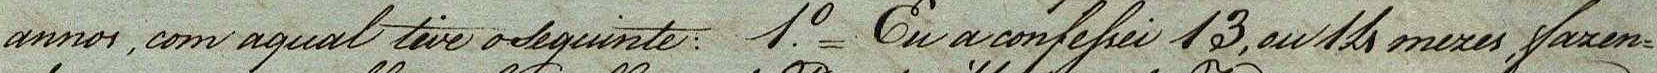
annos, com a qual tive o seguinte: 1.º = Eu a confessei 13, ou 14 mezes, fazen
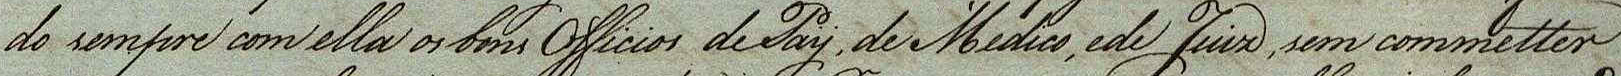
do sempre com ella os bons Officios de Pay, de Medico, e de Juiz, sem commetter
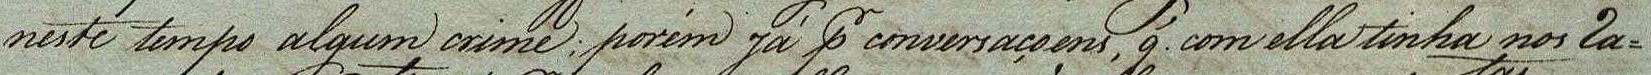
neste tempo algum crime; porém já p.r conversaçoens, q̄ com ella tinha nos Ra
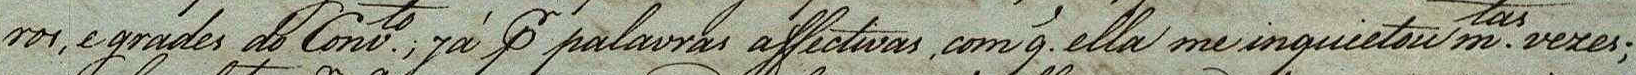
ros, e grades do Conv.to; já p.r palavras affectivas, com q̄ ella me inquietou m.tas vezes;
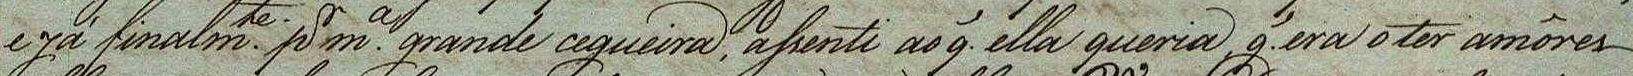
e já finalm.te p.r m.a grande cegueira, assenti ao q̄ ella queria, q̄ era o ter amôres
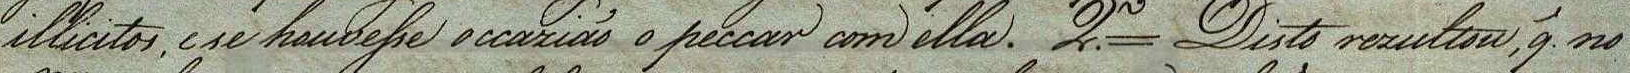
illicitos, e se houvesse occaziao o peccar com ella. 2.º = Disto rezultou, q̄ no
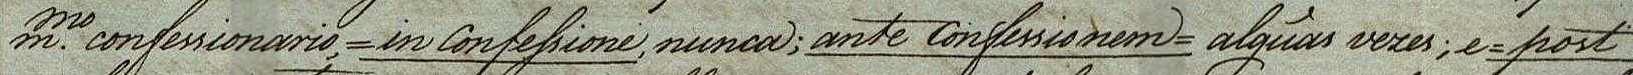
m.mo confessionario, = in confessione, nunca; ante confessionem = algūas vezes; e = post
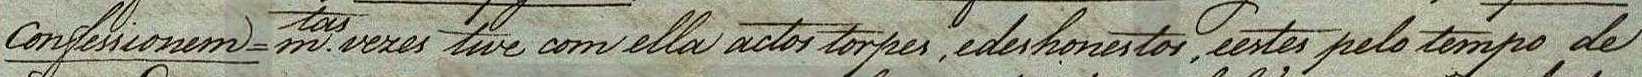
confessionem = m.tas vezes tive com ella actos torpes, e deshonestos, e estes pelo tempo de
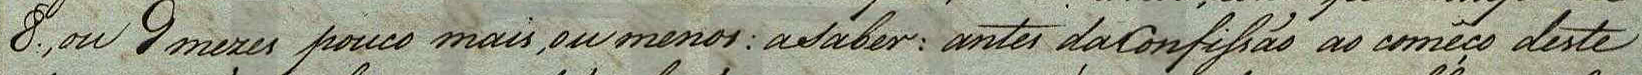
8, ou 9 mezes pouco mais ou menos: a saber: antes da confissaõ ao começo deste
